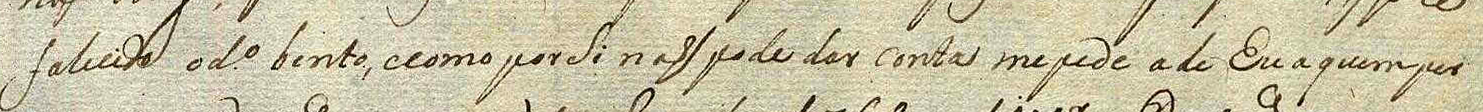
falecido o d.o bento, e como por Si naõ pode dar conta me pede a de Eu a quem per
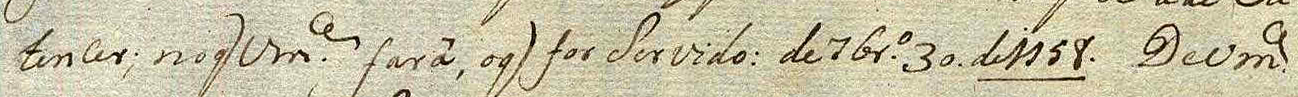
tencer; no q̄ v m.ce fará, o q̄ for Servido: de 7br.o 30 de i758. De v mce
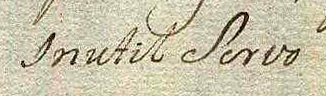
Inutil Servo
